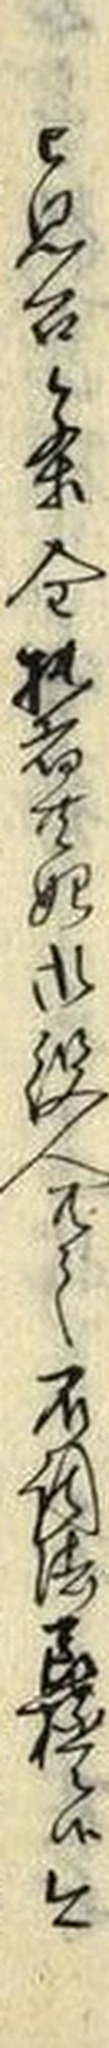被思召候条全拙者共始御役人共之不調法至極ニ候今
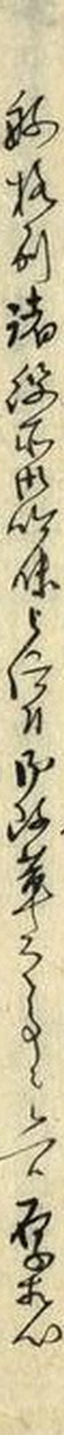般格別諸役所御吟味被仰付御改革之事ニ候へハ厚相心
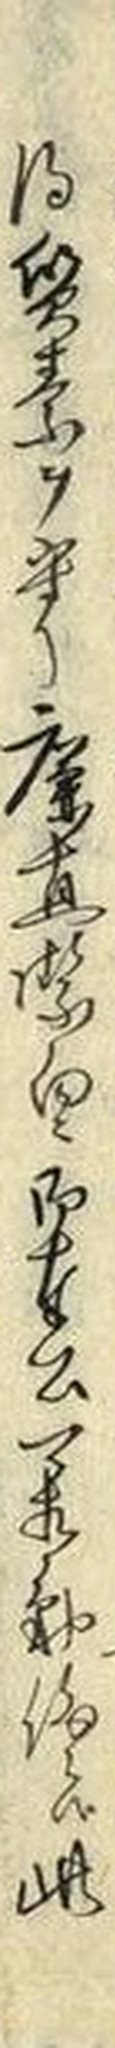得質素ヲ守り廉直潔白ニ御奉公可相勤儀ニ候此
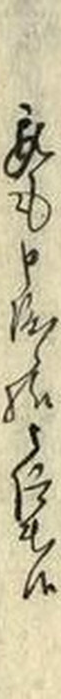段も申渡候様被仰出候
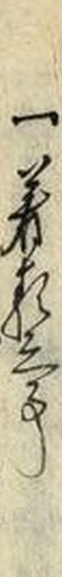一着類之事
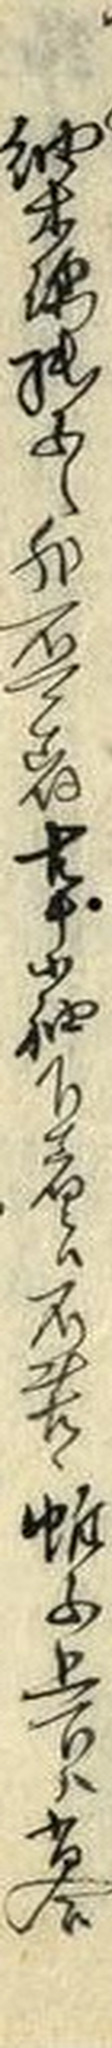紬木綿紙子之外不可着尤半小袖下着ニハ不苦候帷子上下ハ有合
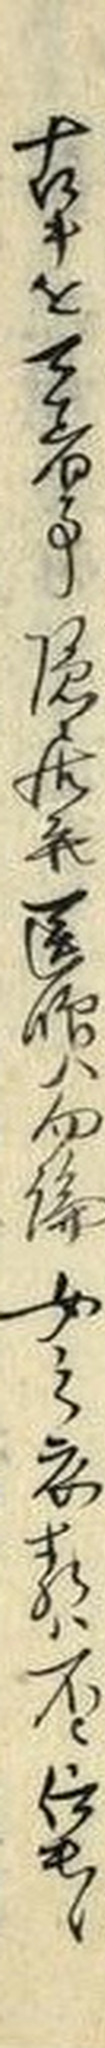古キを可着事隠居并医師ハ勿論女之衣類ハ不被仰出候
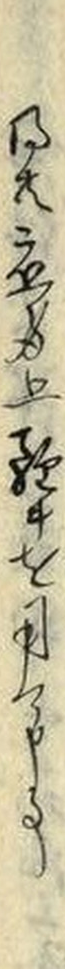得共応身上軽キを用可申候事
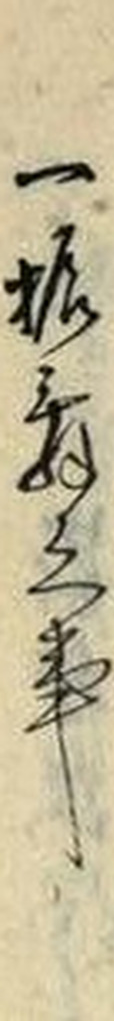一振舞之事

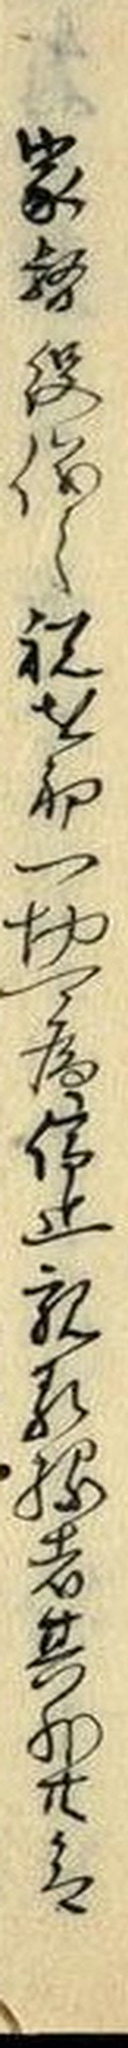家督役儀之祝を初一切可為停止親類縁者其外共ニは
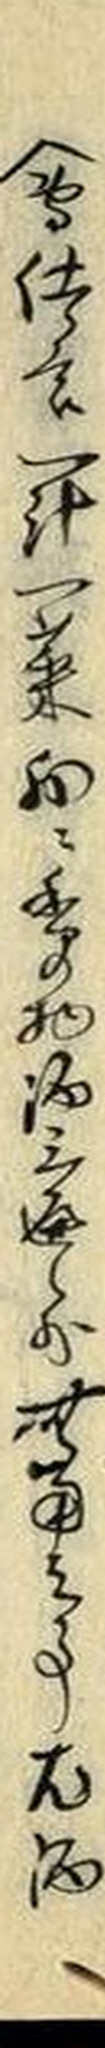会仕候節一汁一菜外ニ香の物酒三通之外無用之事尤酒
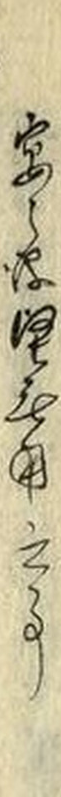宴之儀堅無用之事
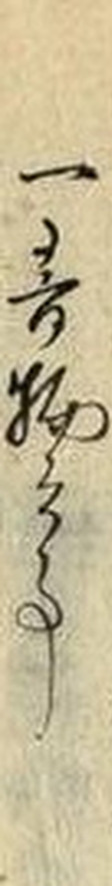一音物之事
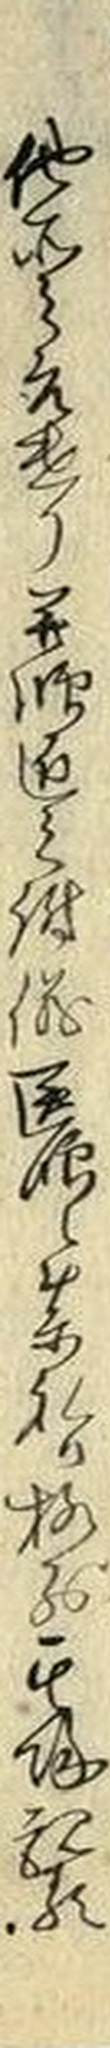他所之取遣り并師匠の附儀医師之薬礼ハ格別其餘親類
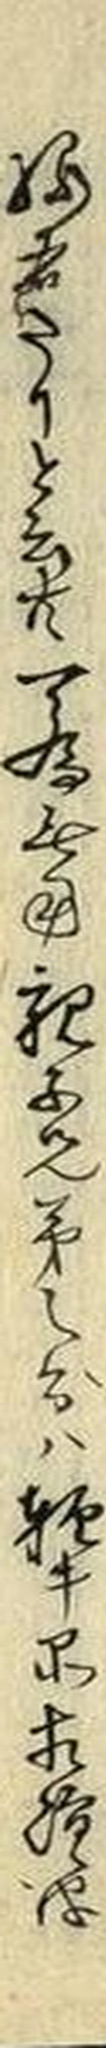縁者たりと云共可為無用親子兄弟之分ハ軽キ品相贈候儀
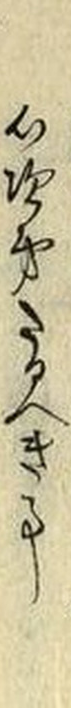心次第たるへき事
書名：少傅日録抄（斉承付側向頭取日記、在府）
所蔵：福井県文書館 Fukui Prefectural Archives
